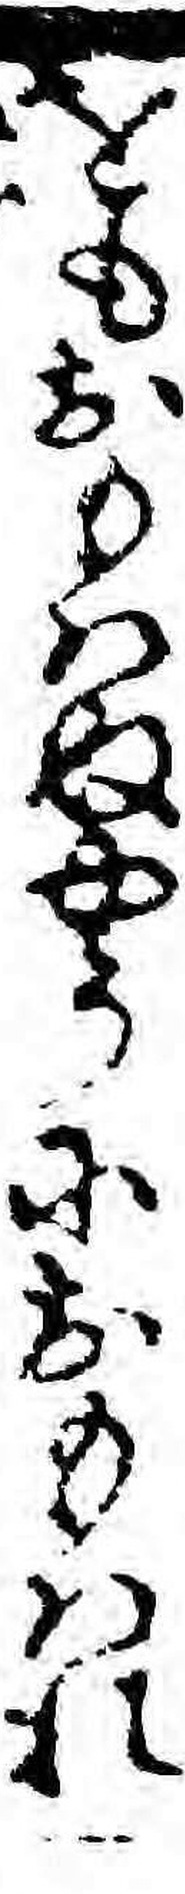をもおもはぬやうにおもはれ
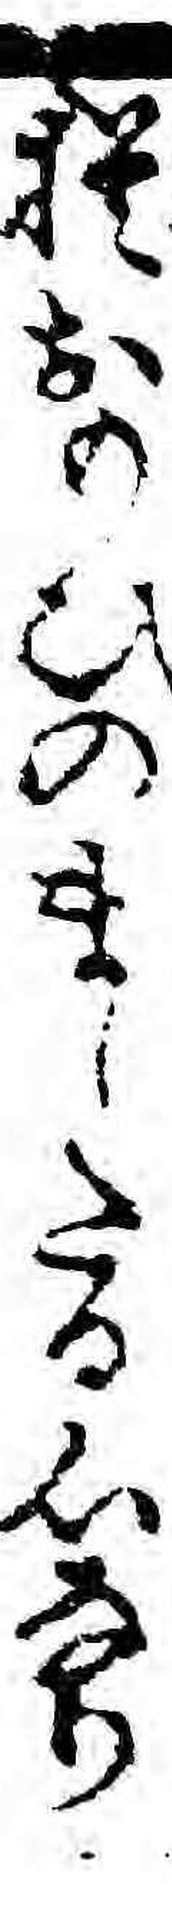猶おもひのましたる心なり
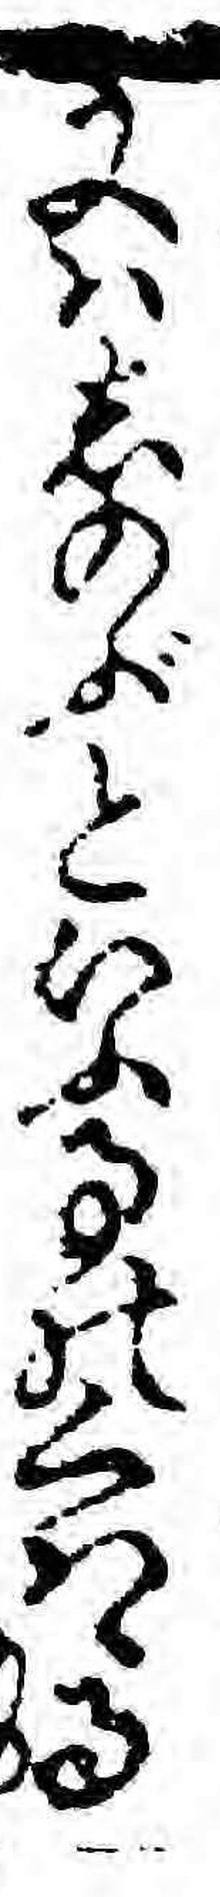又はしのぶといふ事のくはゝる
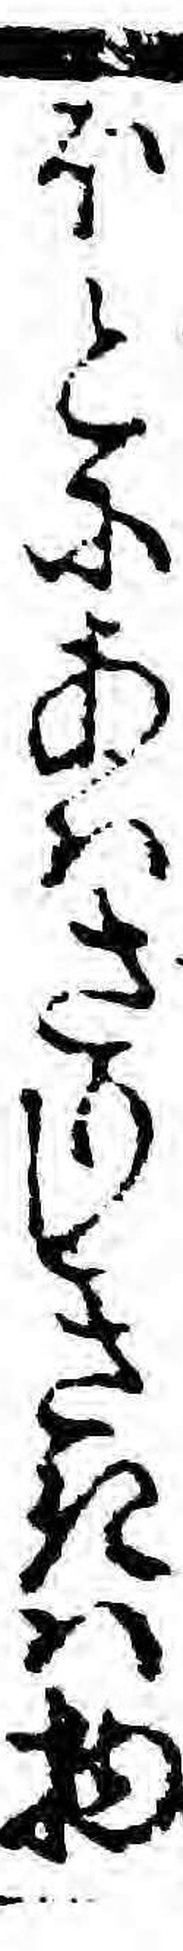ほとにあはさりしさきは物
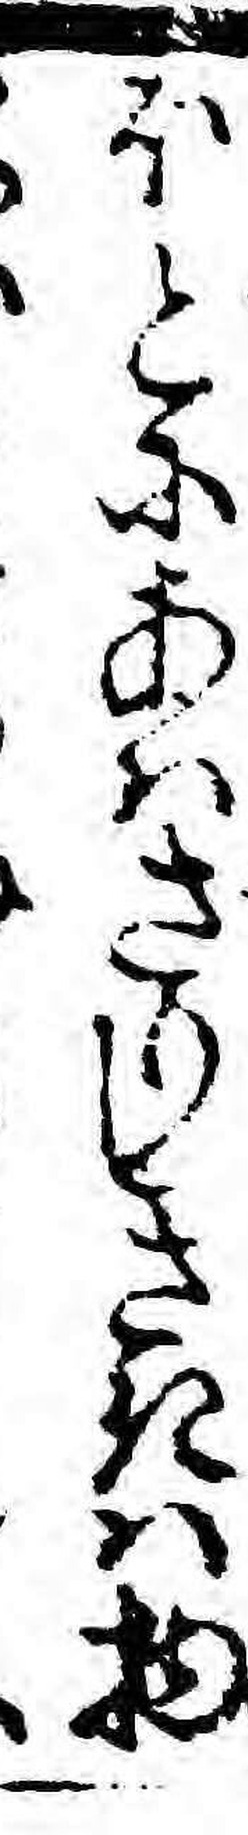ほとにあはさりしさきは物
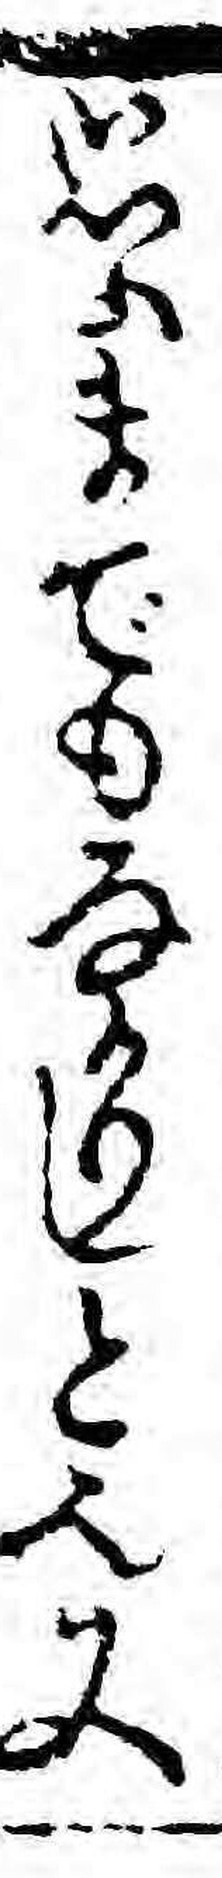思ふまでもなかりしと也又
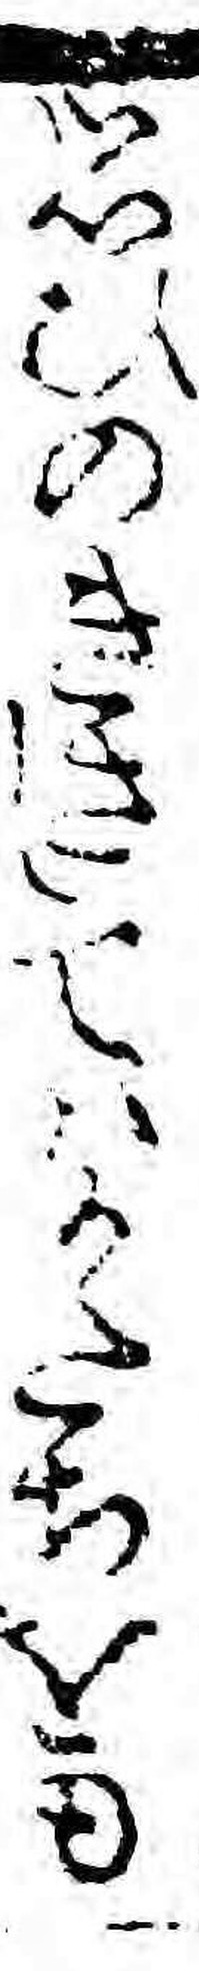思ひのきさしてはかたちをも
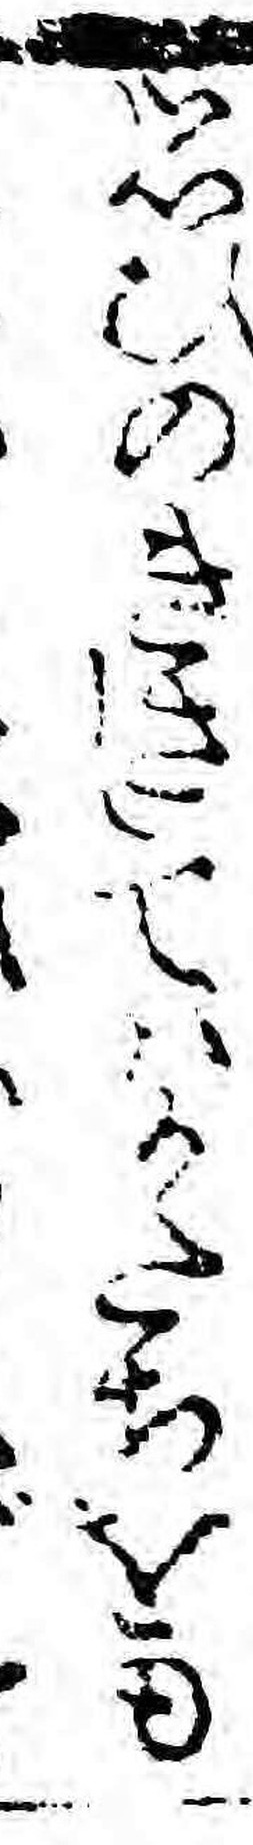思ひのきさしてはかたちをも
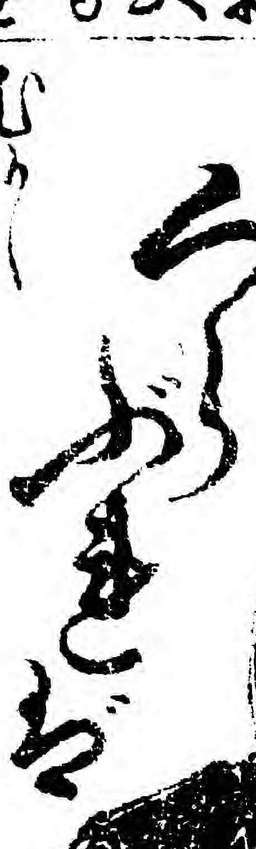ぶれば
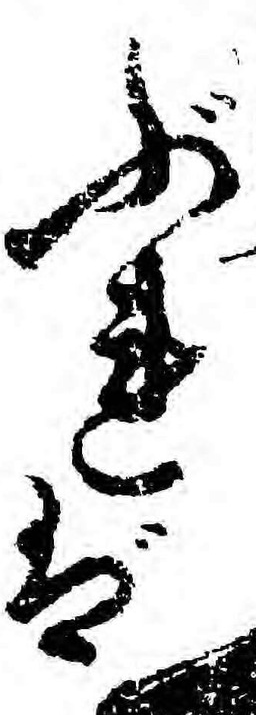ぶれば
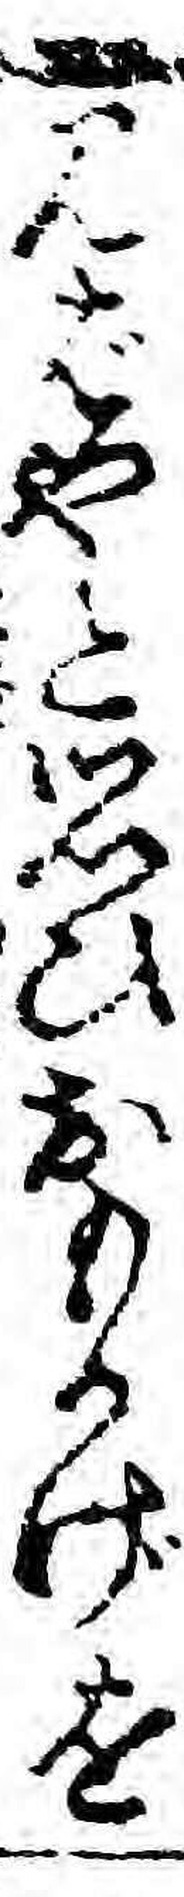見ずやと思ひおもかげを
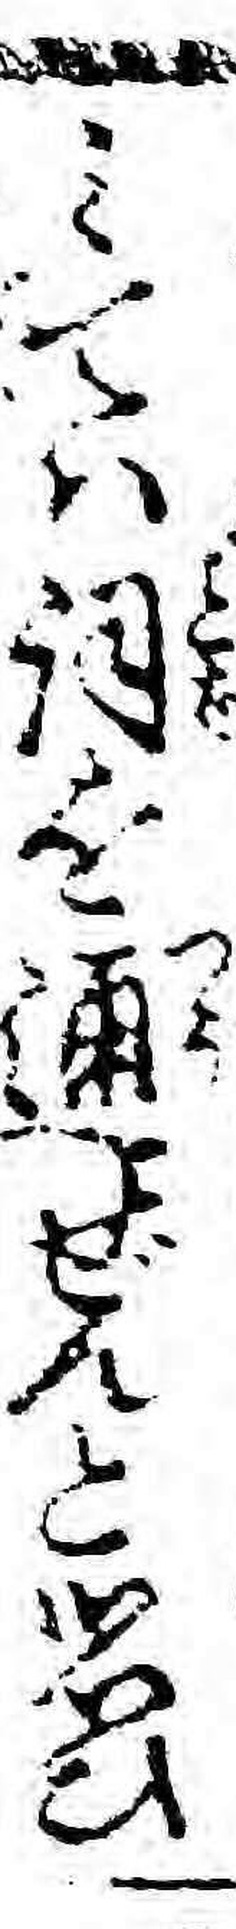みては詞を通ぜんと思ひ
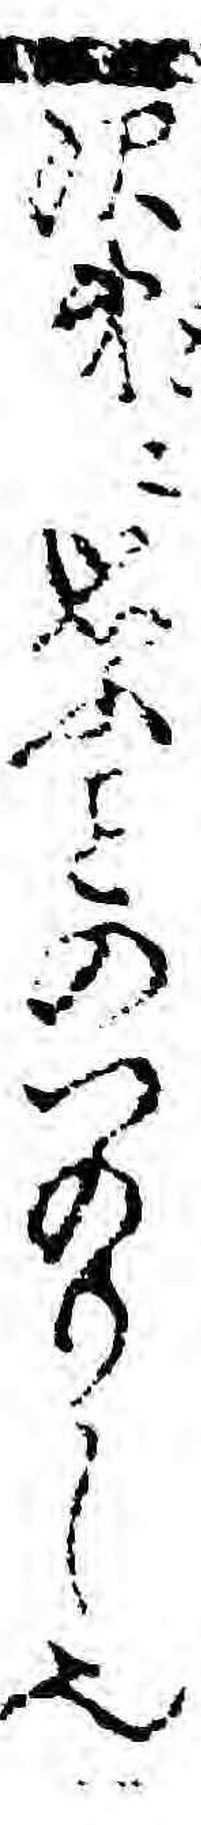次第に思ふことのつのりし也
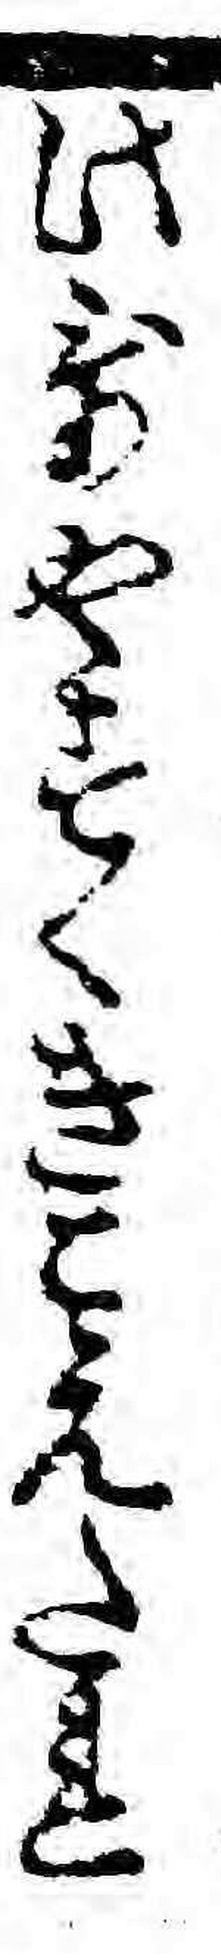此哥やすくきこえたれ
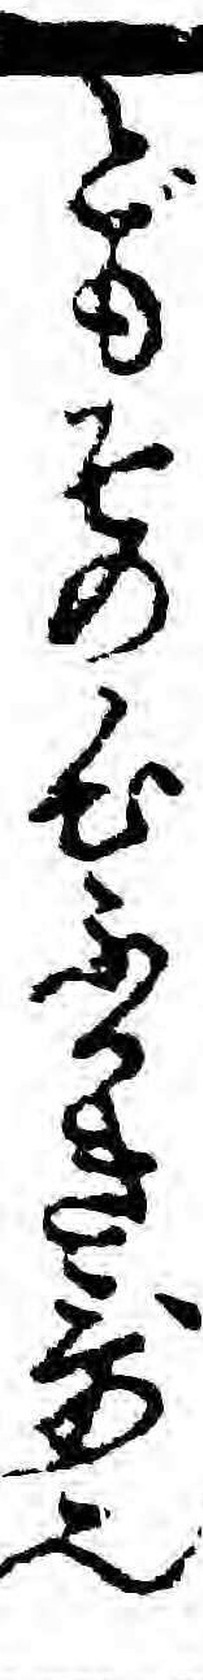どもその心ふかき哥也
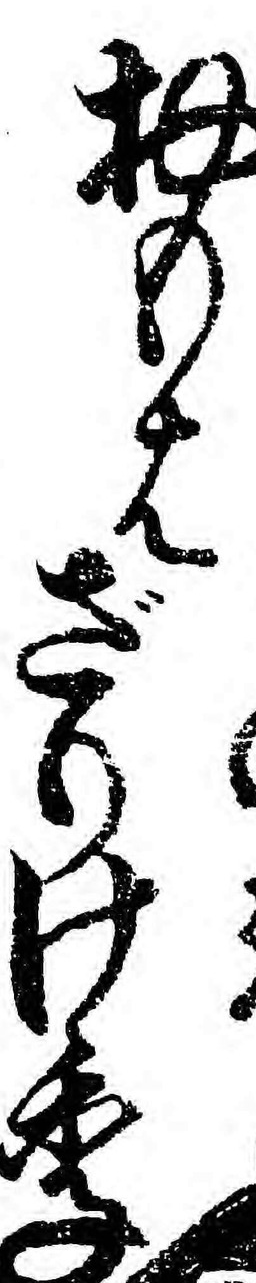おもはざりけり
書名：頭書和歌注譯／壽賀多百人一首小倉錦
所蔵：国文学研究資料館
